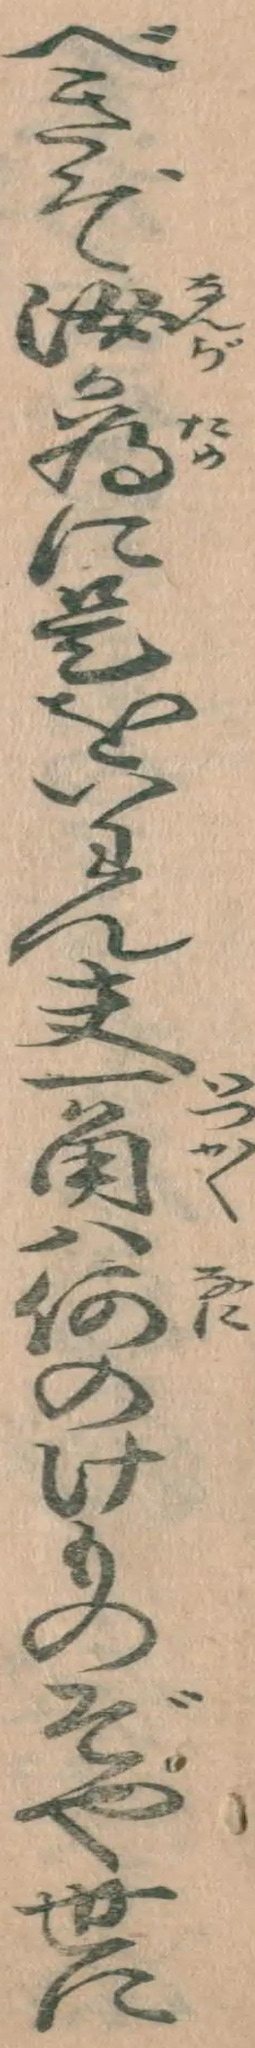べきで汝か為に是をいわん夫一角は何のけものぞや世に
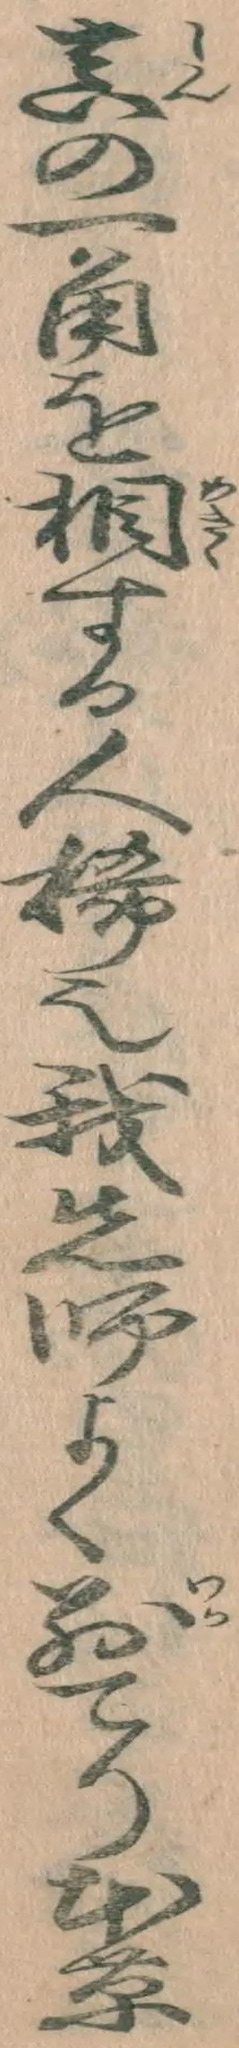真の一角を相する人稀也我先師よく別てり本草
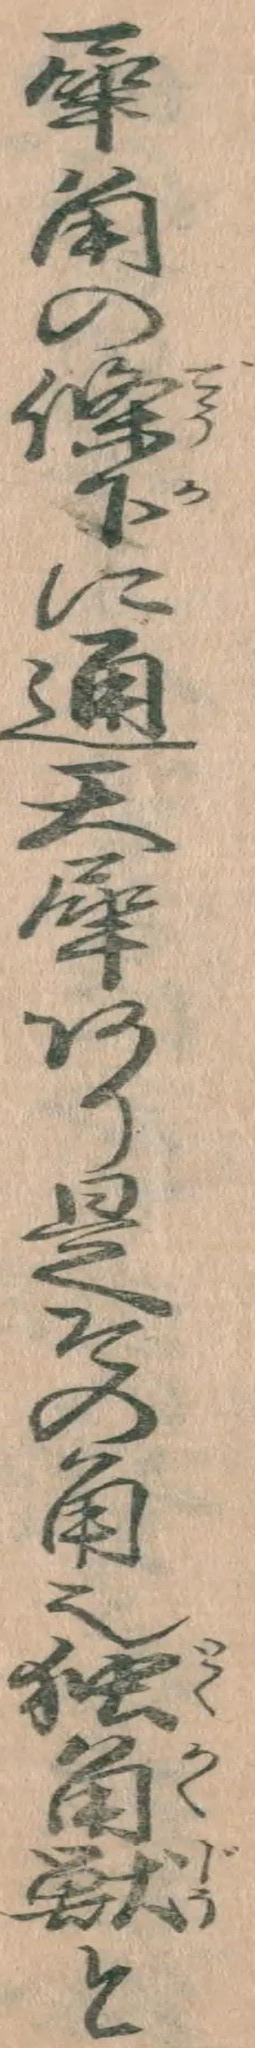犀角の条下に通天犀あり是その角也独角獣と
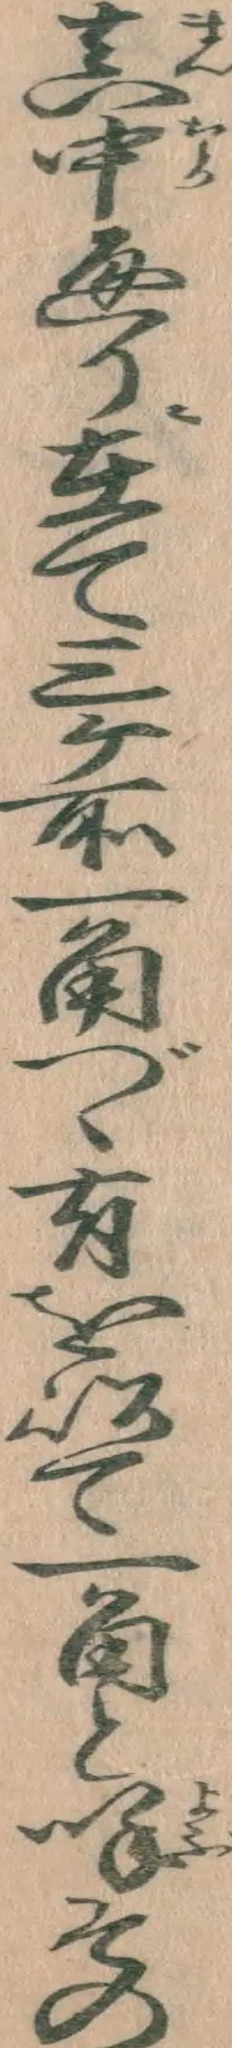真中通り在て三ヶ所一角づゝ有を以て一角と呼その
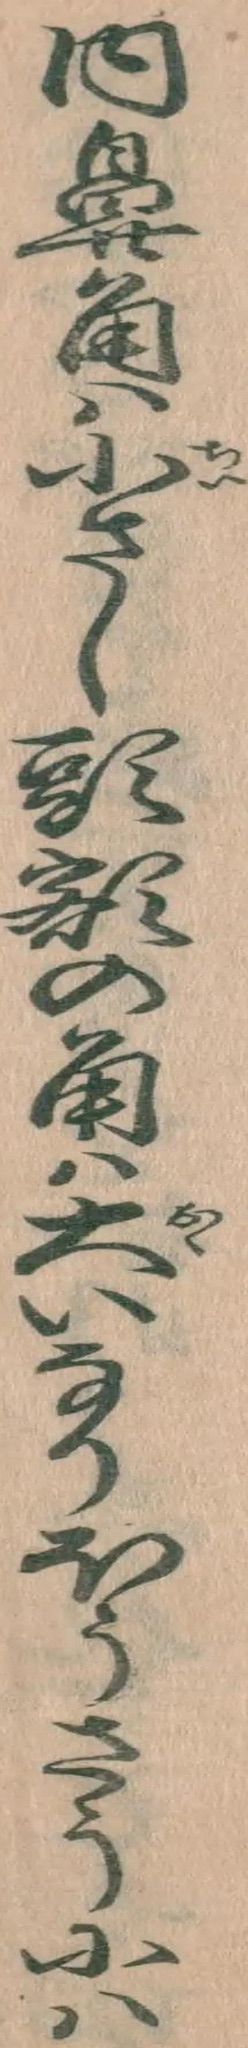内鼻角は小さし頭額の角は大いなりほうさうには
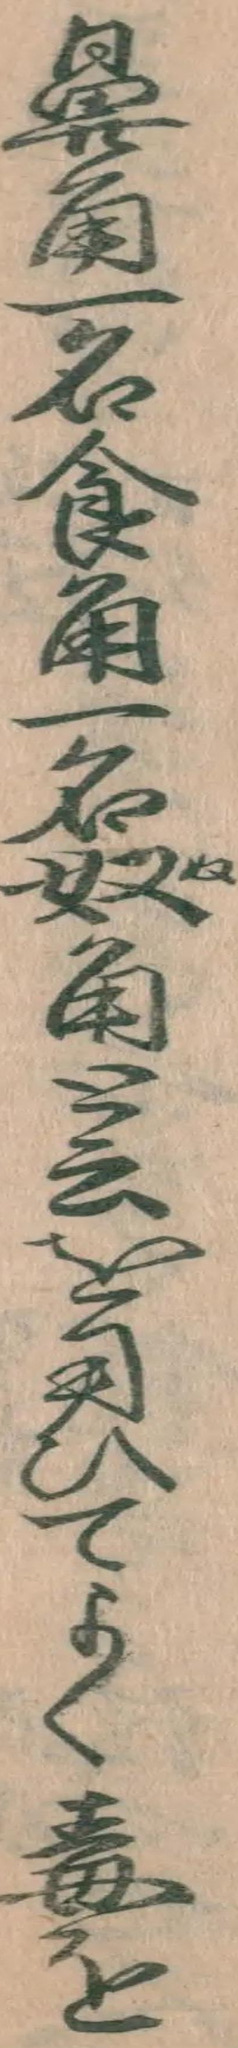鼻角一名食角一名奴角と云を用ひてよく毒を
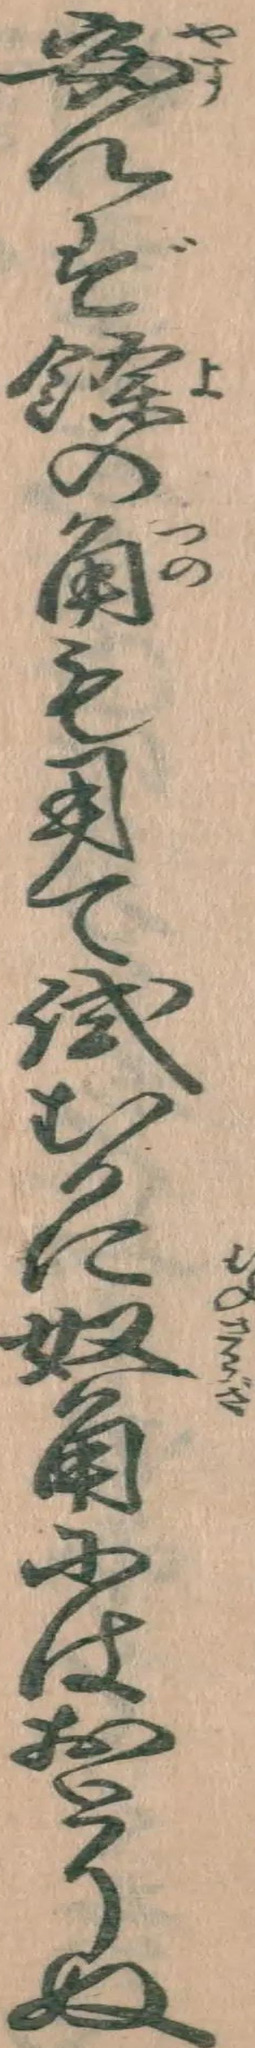安んず余の角も用て試むるに奴角にはおとりぬ
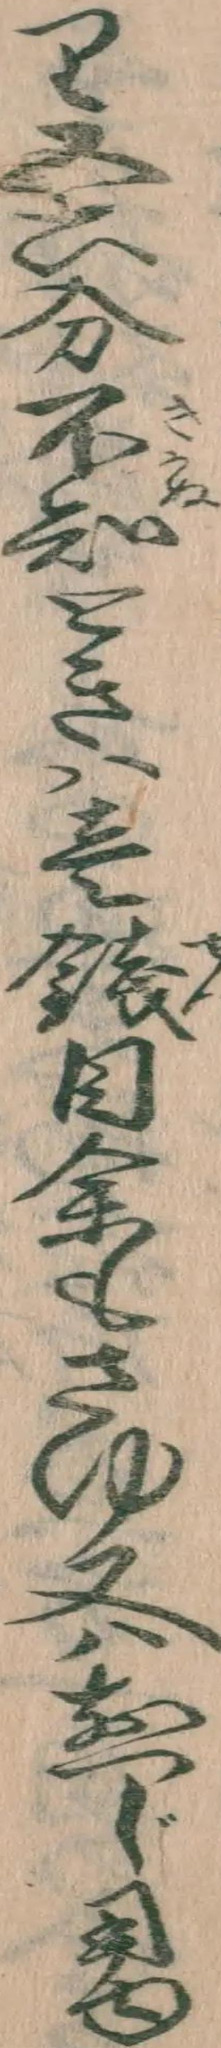り五六分不知ときは壱銭目余もさゆ又は煎じ用ゆ
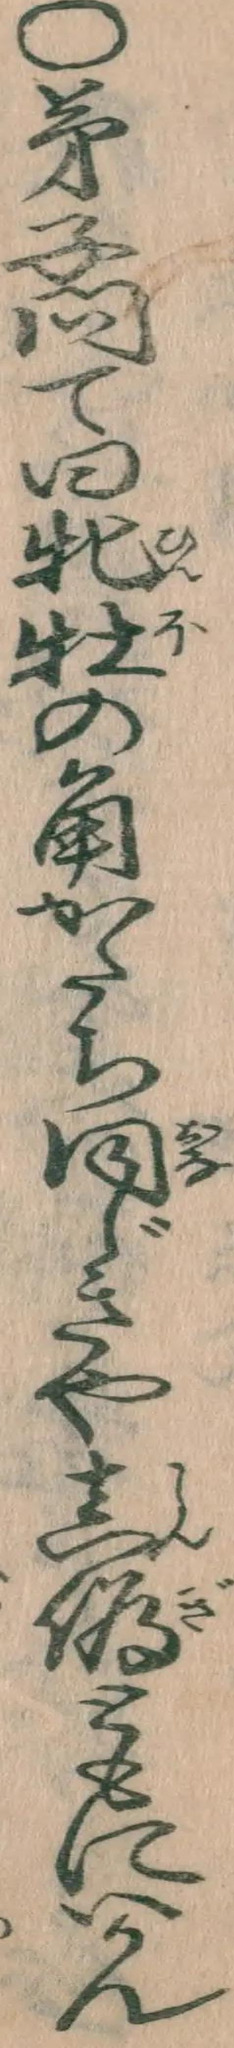○弟子問て曰牝牡の角かたち同じきや真偽ともにいかん
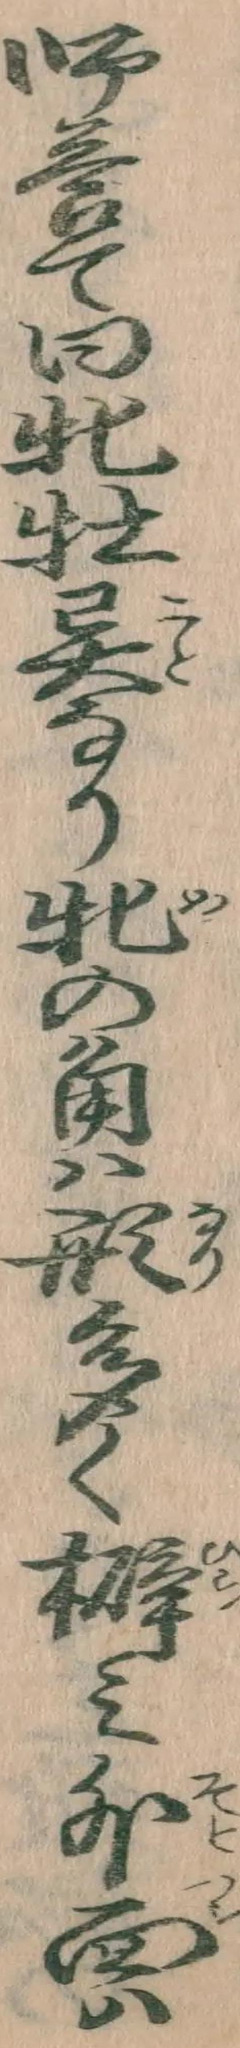師答て曰牝牡異なり牝の角は形多く檘み外面は
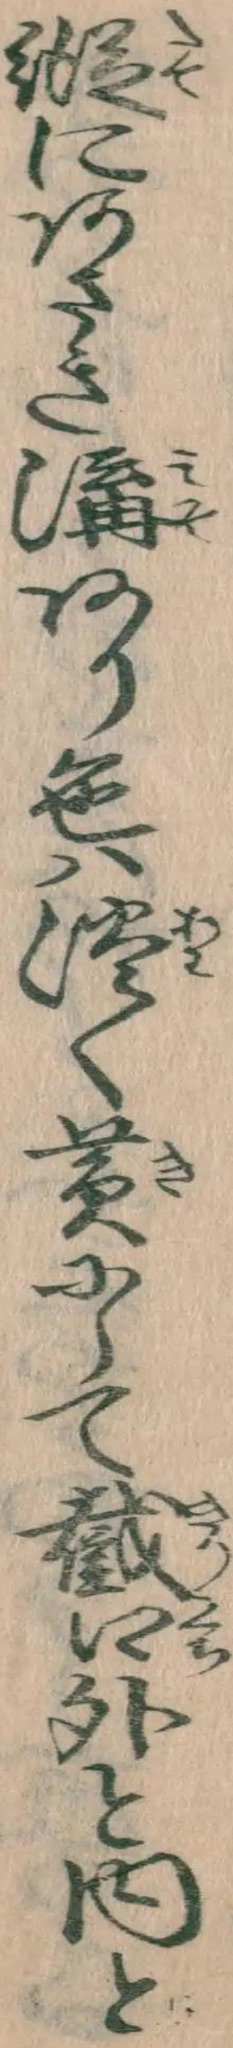縦にあさき溝あり色は淡く黄にして截口外と内と
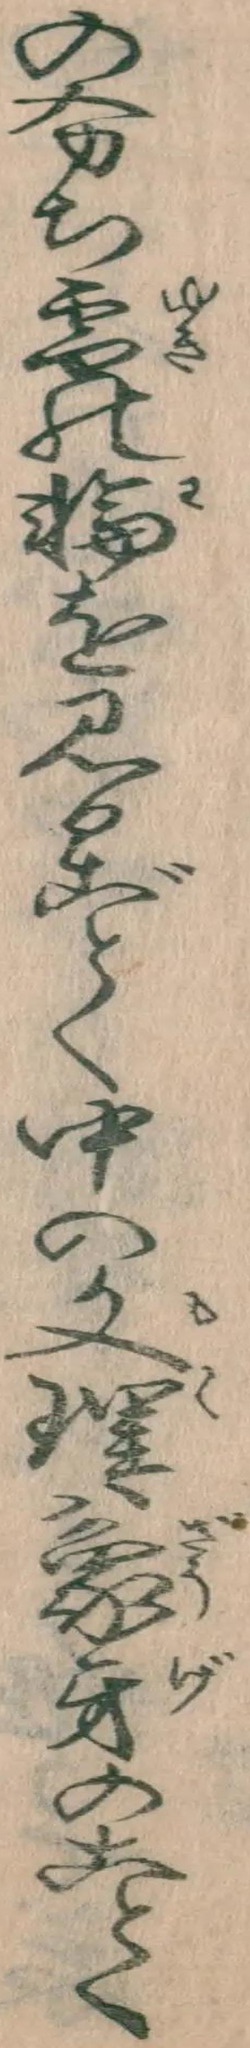の分ち雪の輪を見るごとく中の文理は象牙のことく
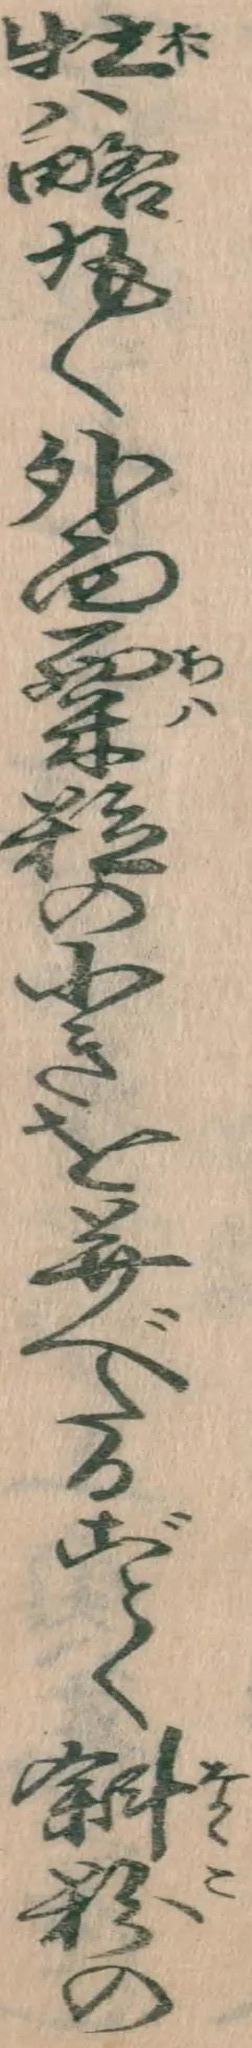牡は略丸く外面粟粒の小きを并べたるごとく斜粉の
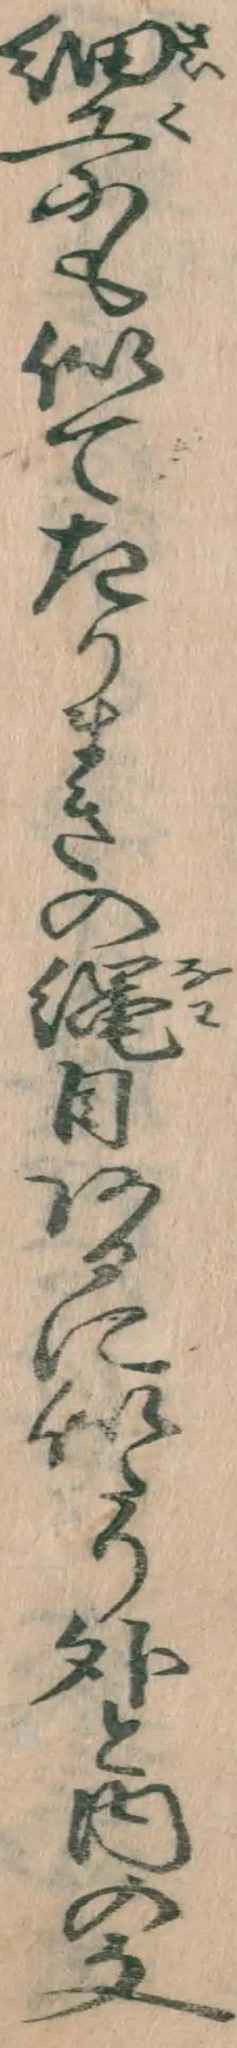細工にも似て左りまきの縄目あるに似たり外と内の文

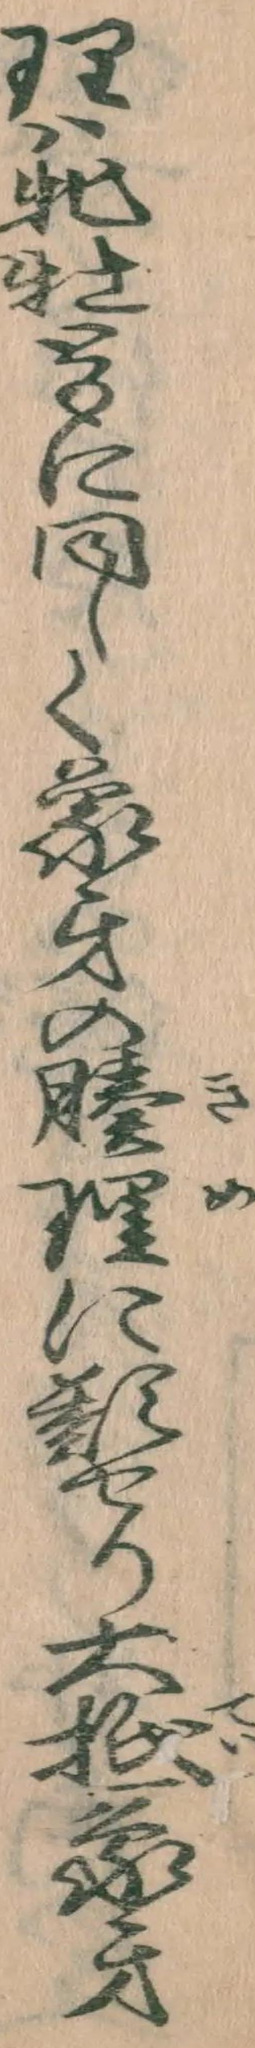理は牝牡ともに同しく象牙の腠理に類せり大扺象牙
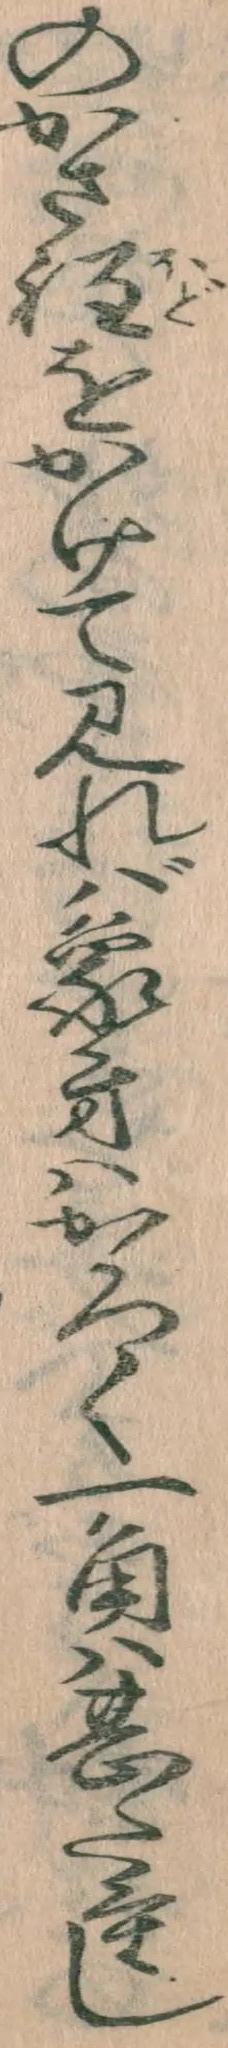のかさ程をかけて見れば象牙はかろく一角は甚た重し
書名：痘家初心問答
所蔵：国立国会図書館 National Diet Library, JAPAN
